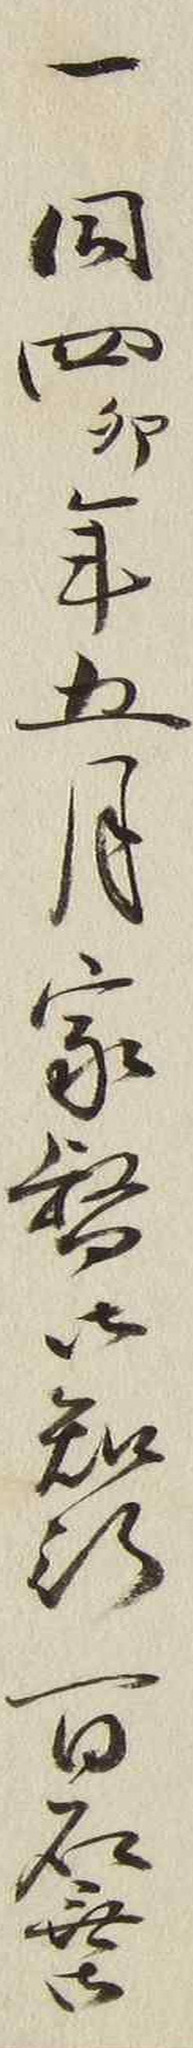一同四卯年五月家督御知行百石無御
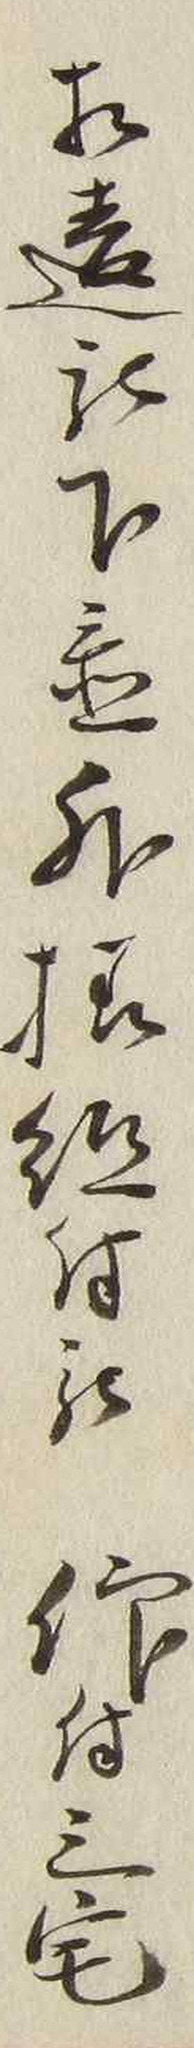相違被下置外様組付被仰付三宅

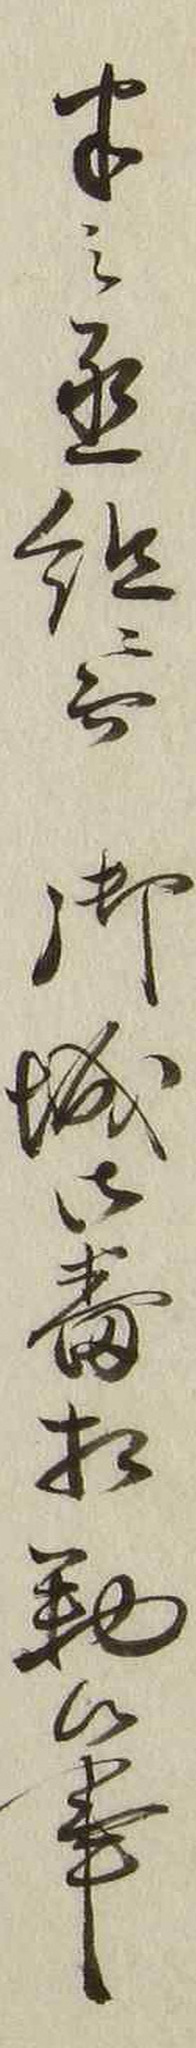半之丞組ニ而御城御番相勤候事
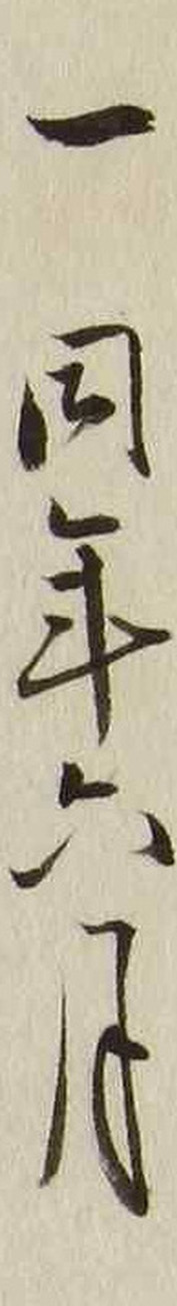一同年六月
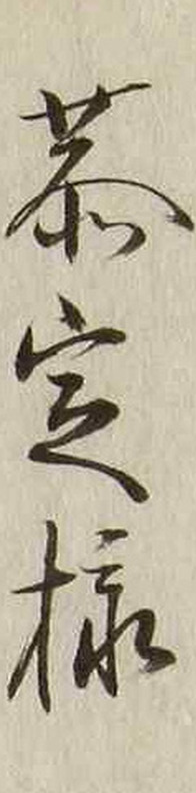恭定様
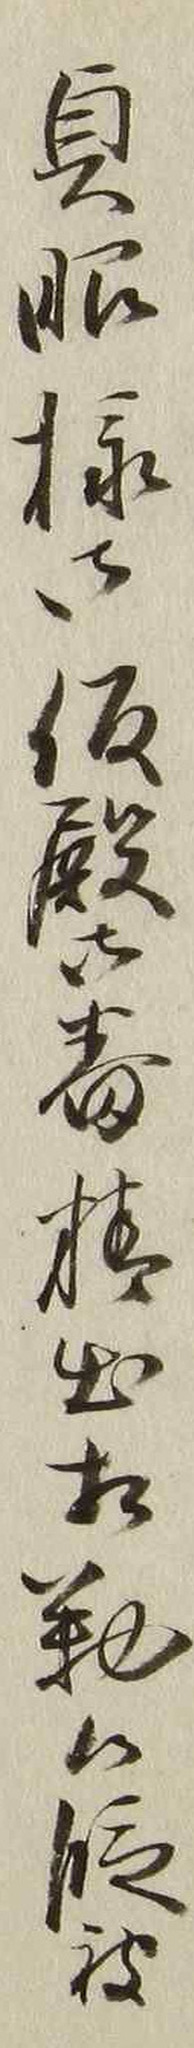貞昭様御仮殿御番精出相勤候段被
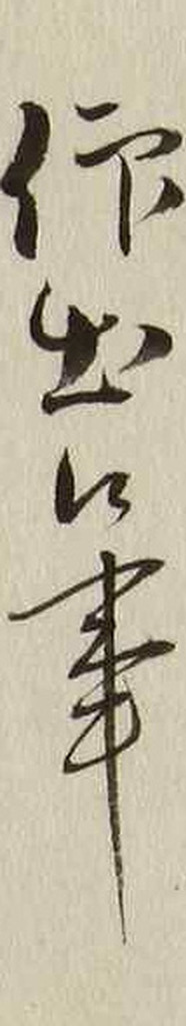仰出候事
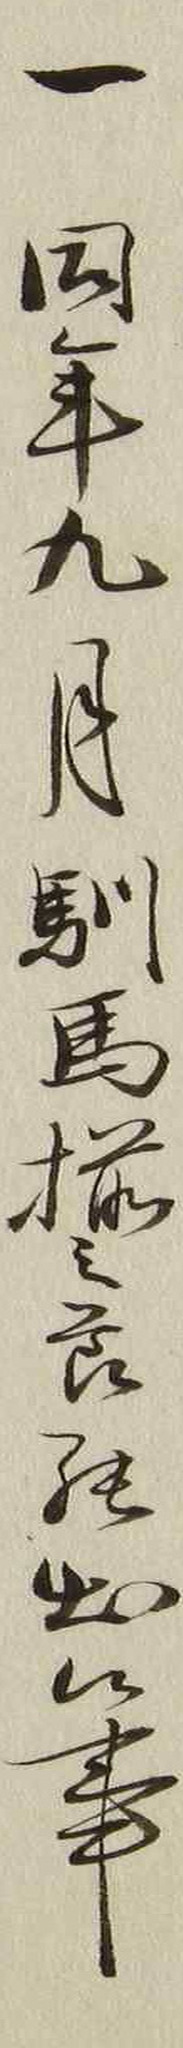一同年九月馴馬揃之節罷出候事
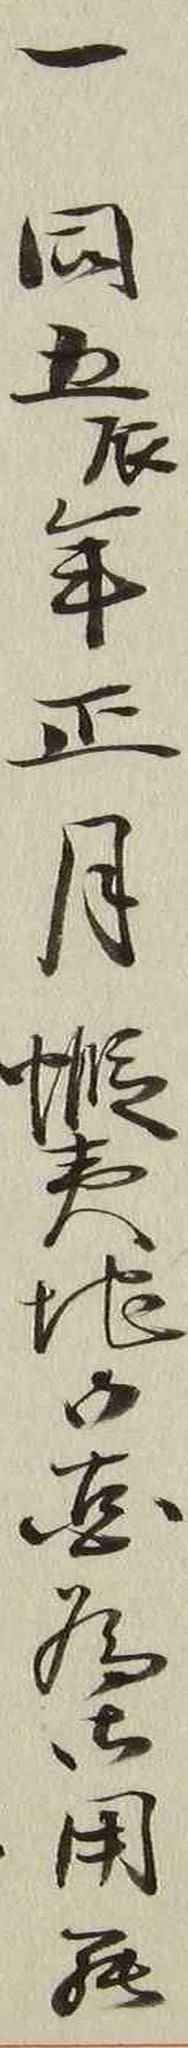一同五辰年正月蝦夷地御固為御用罷
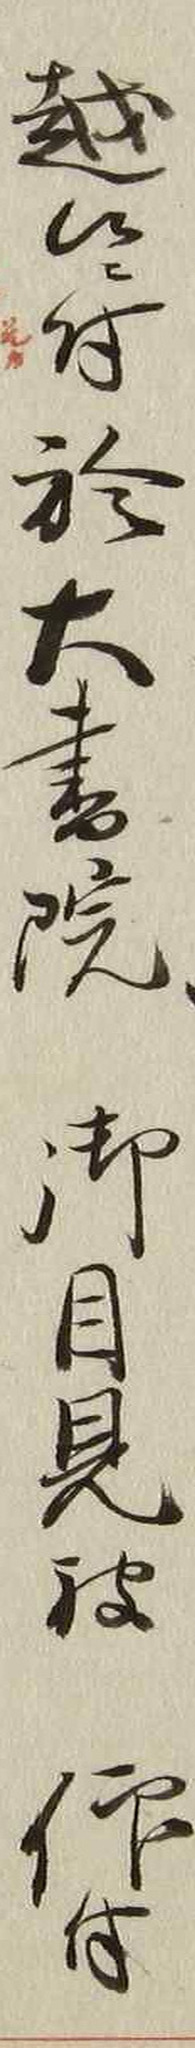越候ニ付於大書院御目見被仰付
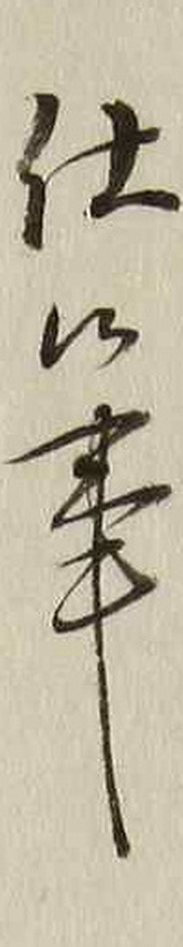仕候事
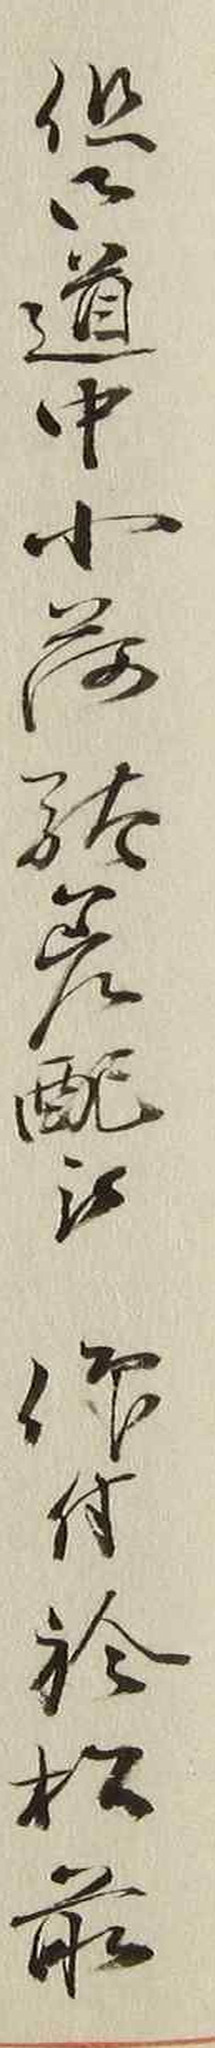但御道中小荷駄差配被仰付於松前
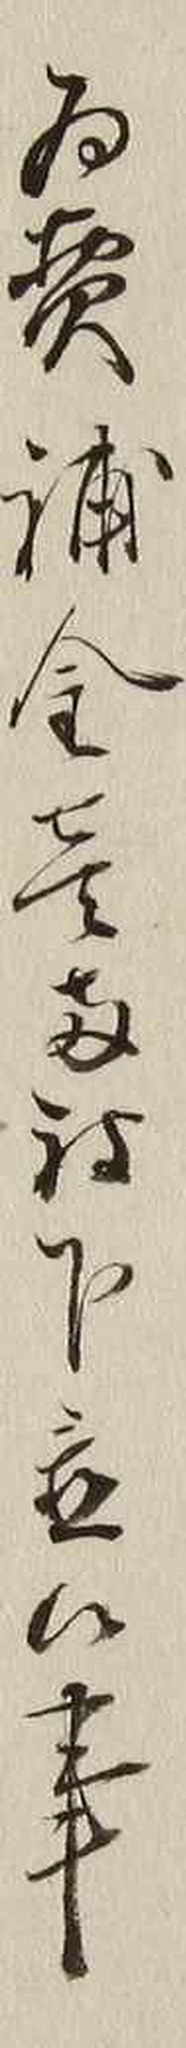為費補金壱両被下置候事
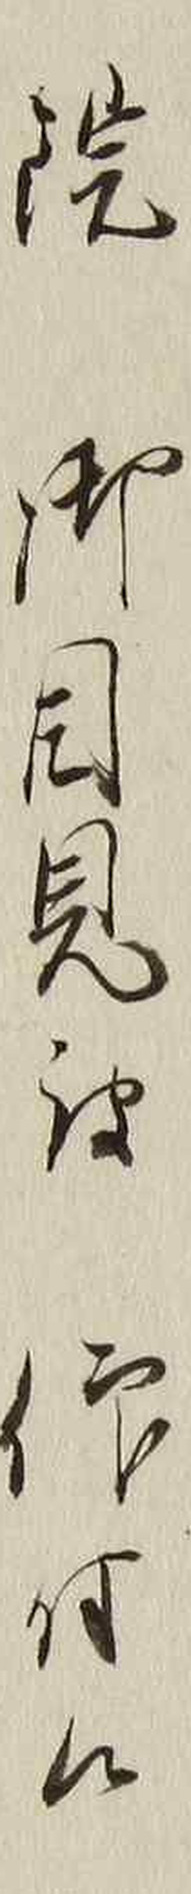院御目見被仰付候
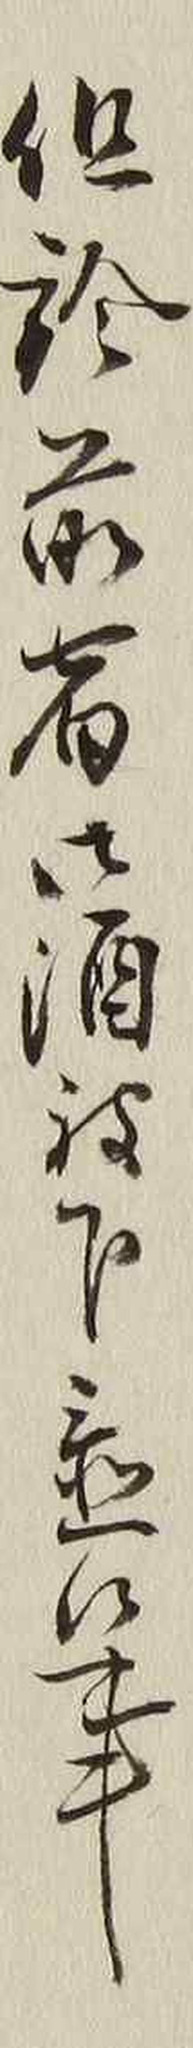但於前宿御酒被下置候事
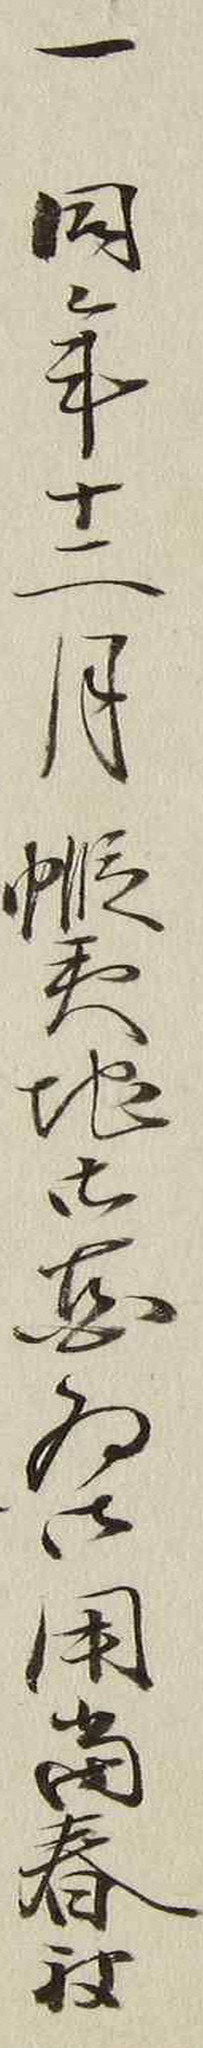一同年十二月蝦夷地御固為御用当春被
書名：諸士系譜　巻之163　な之部5
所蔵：会津若松市立会津図書館
